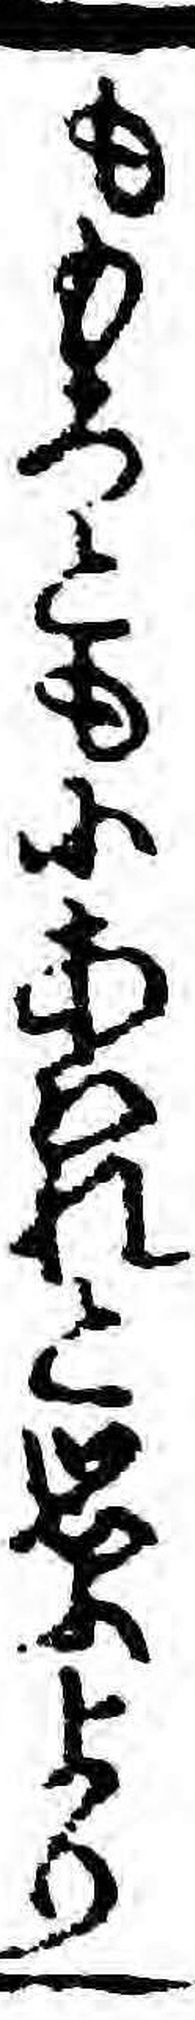ももろともにあはれと思ふより
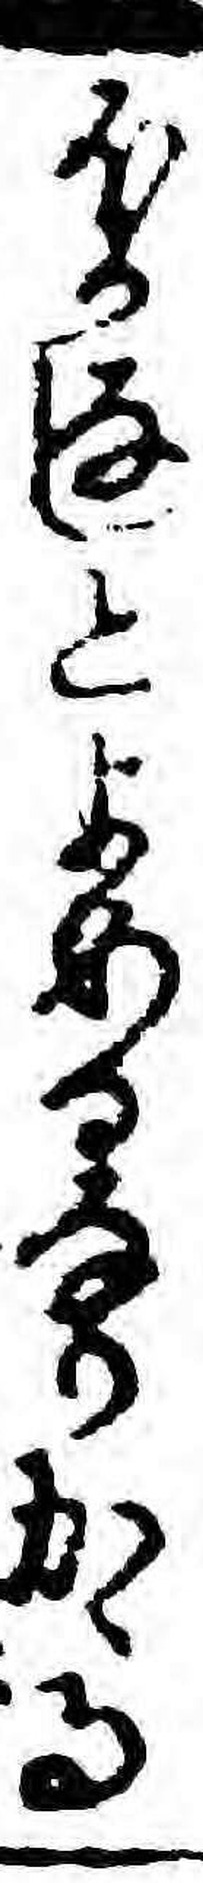ほかなしとよめるなりかゝる
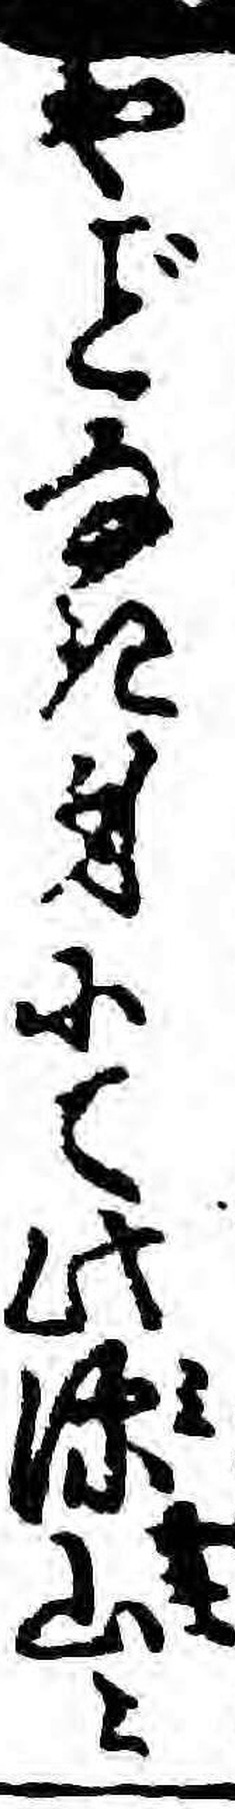やごとなき身にて此の深山に
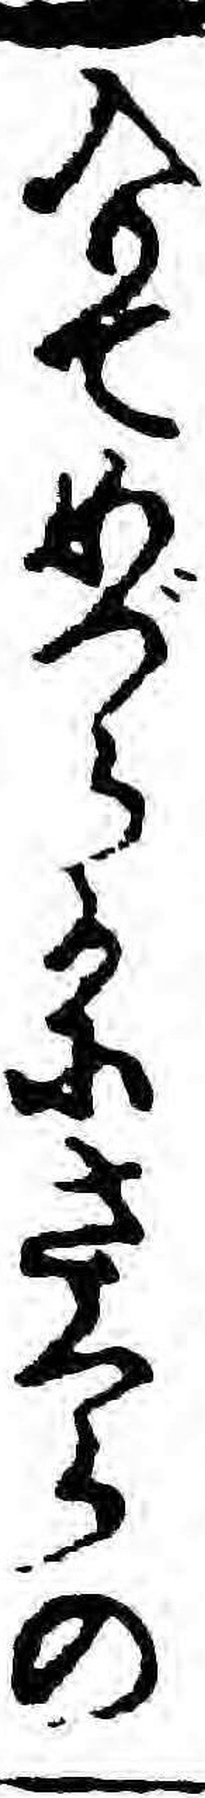入りてめづらかにさくらの
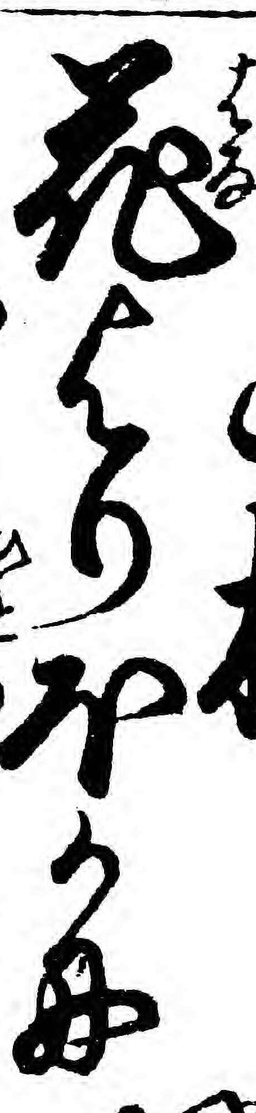花よりほかに
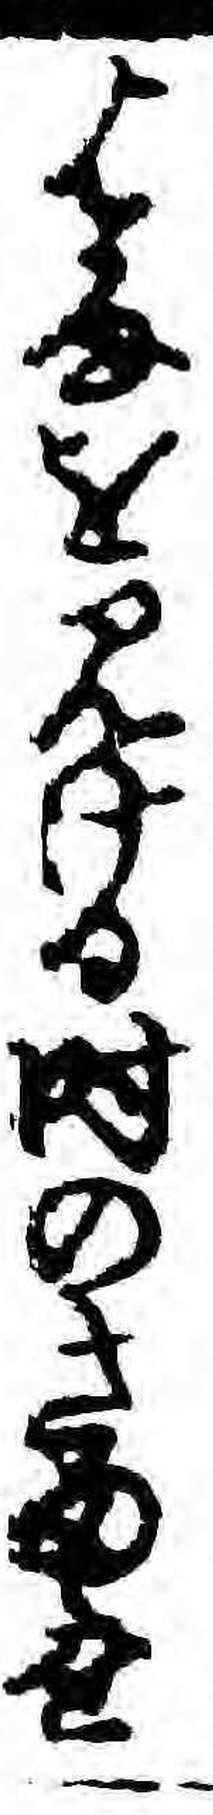はなを見ける時のさまを
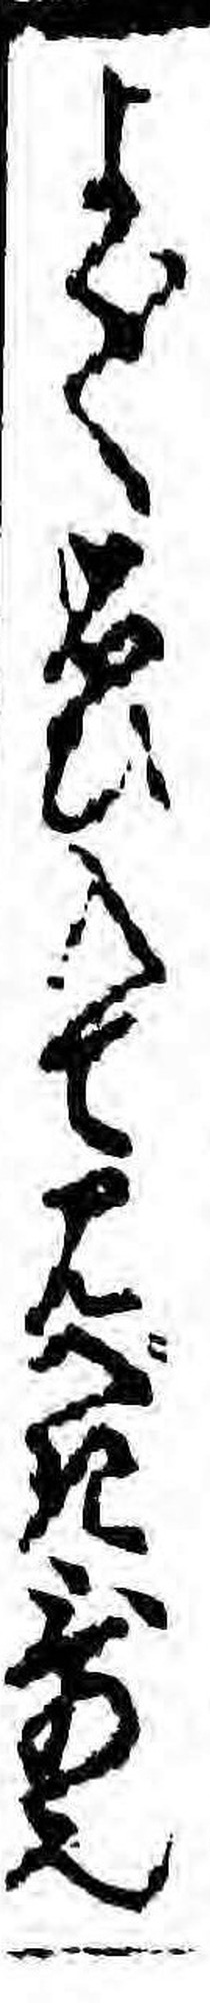よく〳〵思ひ入て見べき哥也
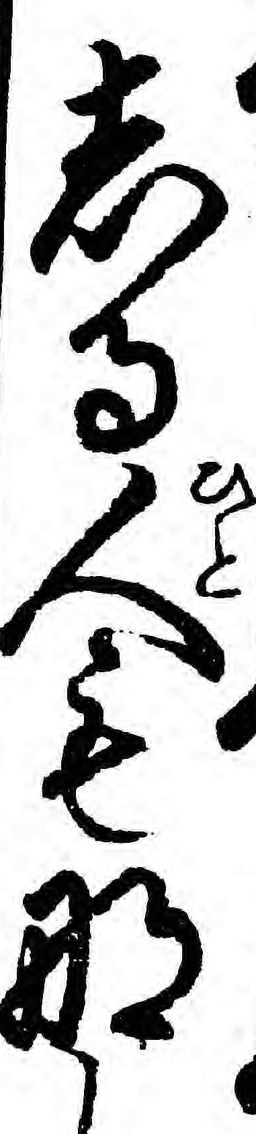しる人もなし
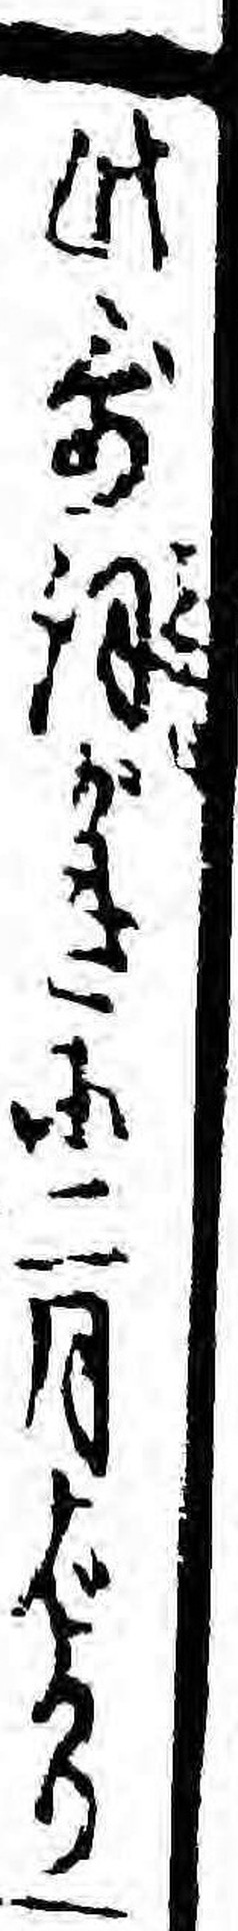此哥詞がきに二月ばかり
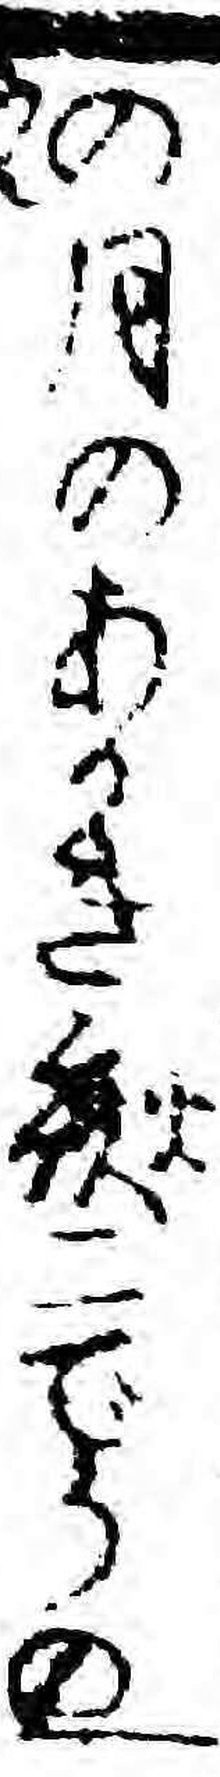の月のあかき夜二でうの
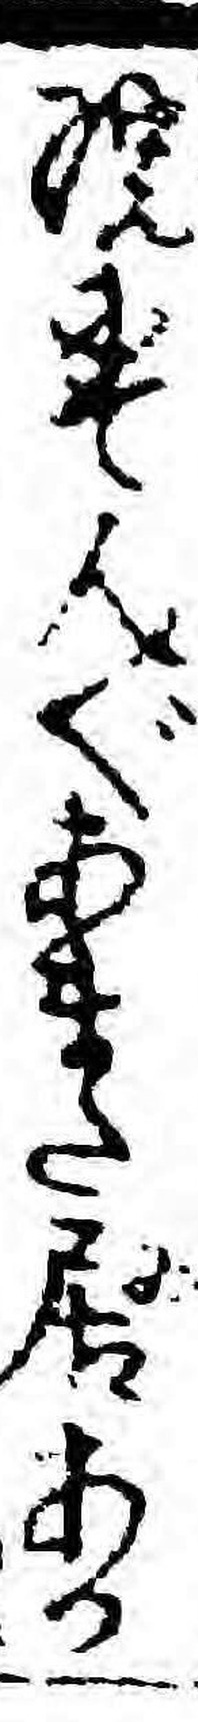院にて人々あまた居あか
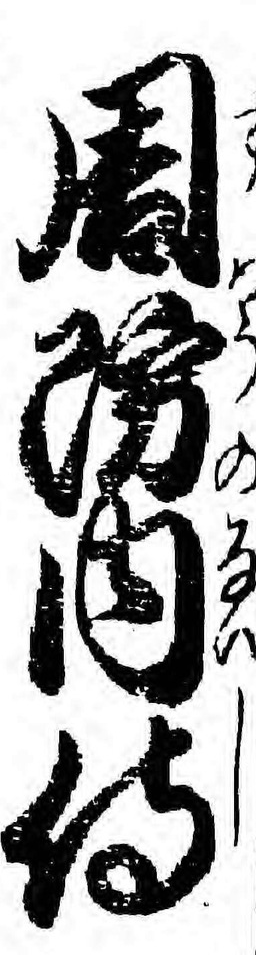周防内侍
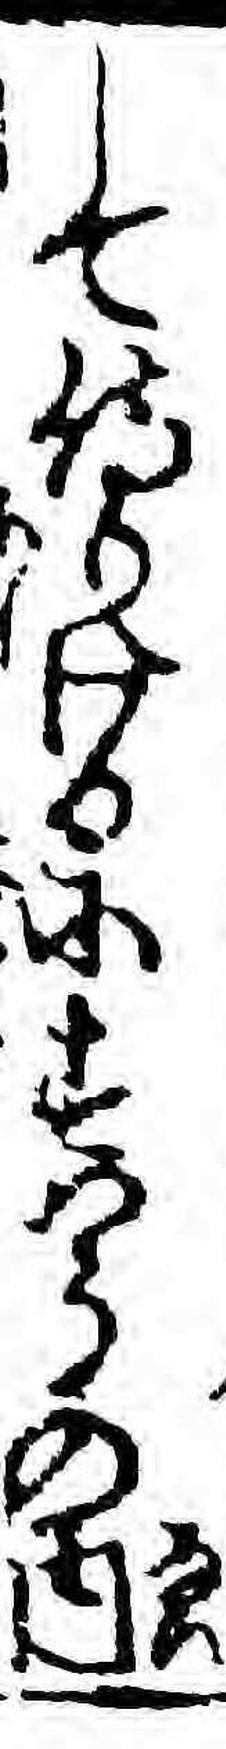して侍りけるにすはうの内
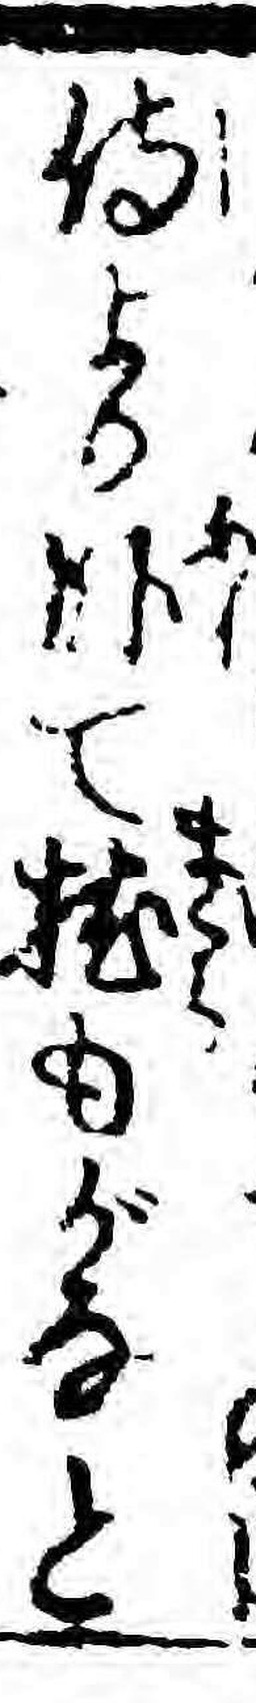侍より臥て枕もがなと
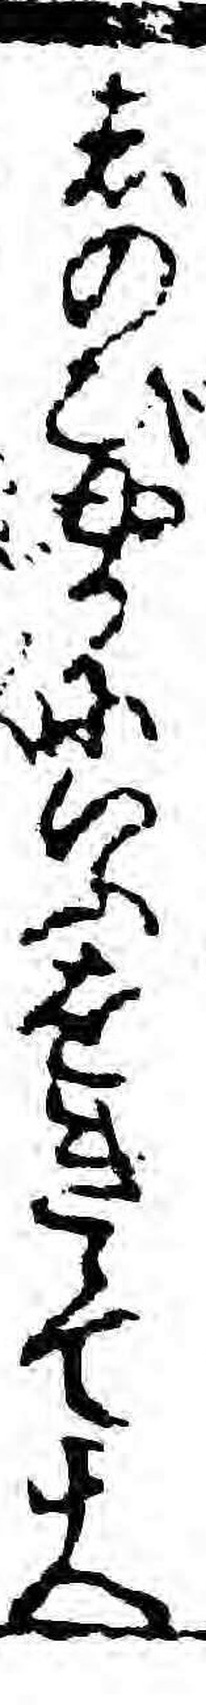しのびやかにいふをきゝて大
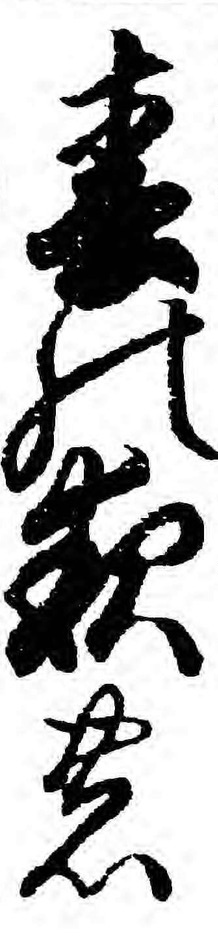春の夜の
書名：頭書和歌注譯／壽賀多百人一首小倉錦
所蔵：国文学研究資料館
